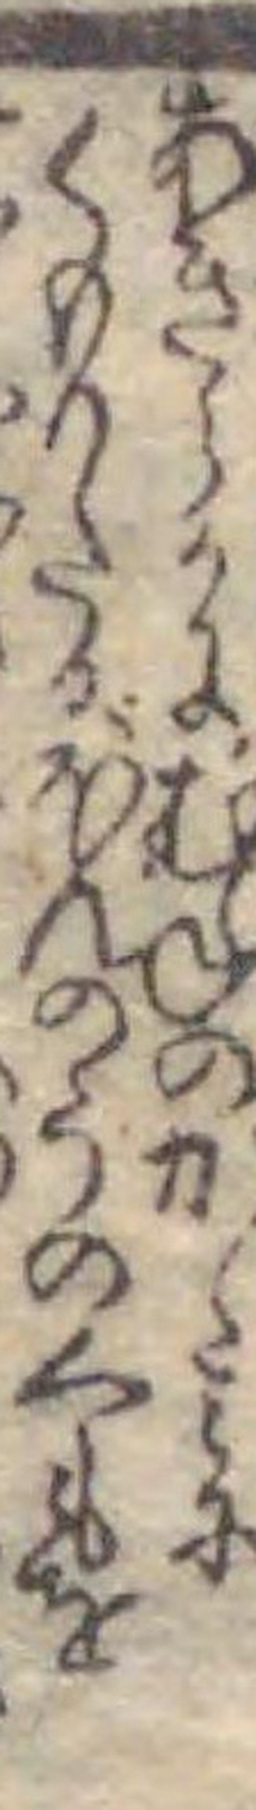くもりたるぼんほうのくもを
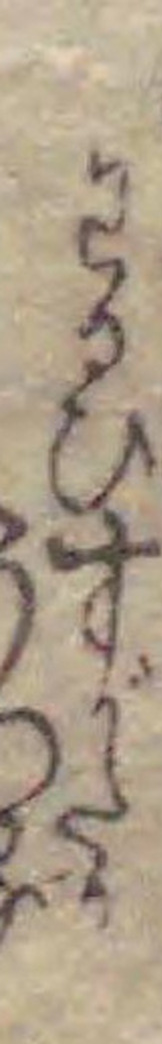わるひすがたか
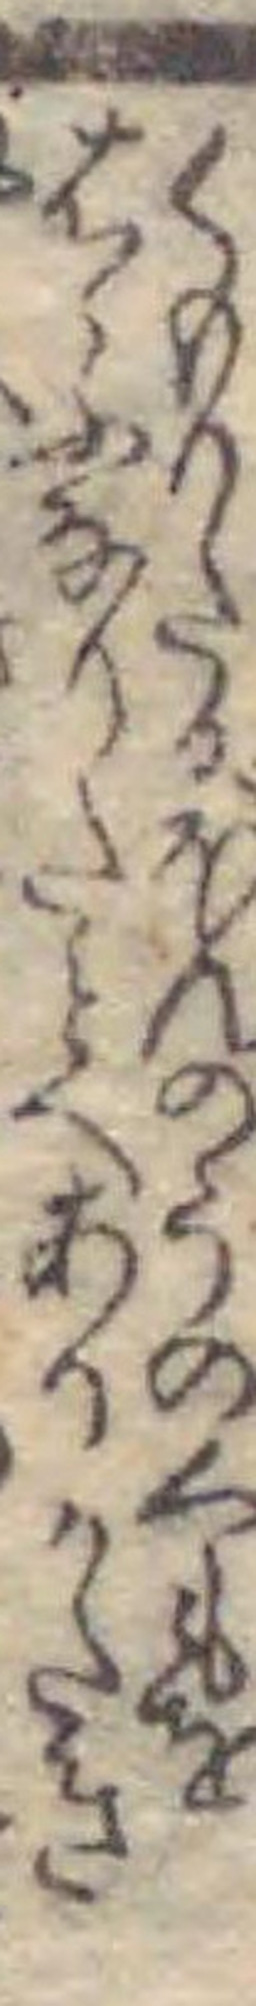はらふなりたとへありかたき
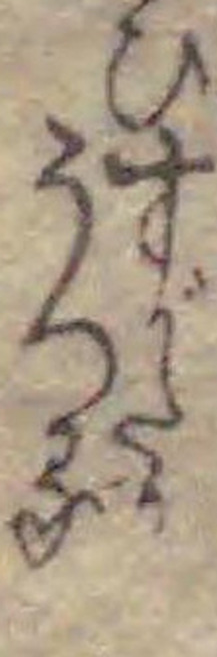うつる
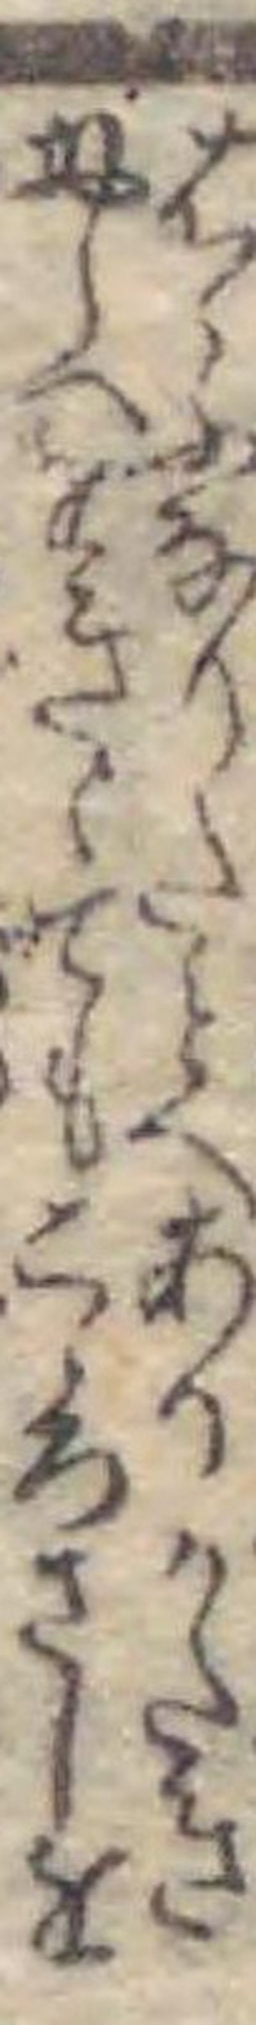おしへをきゝてもこゝろさしを
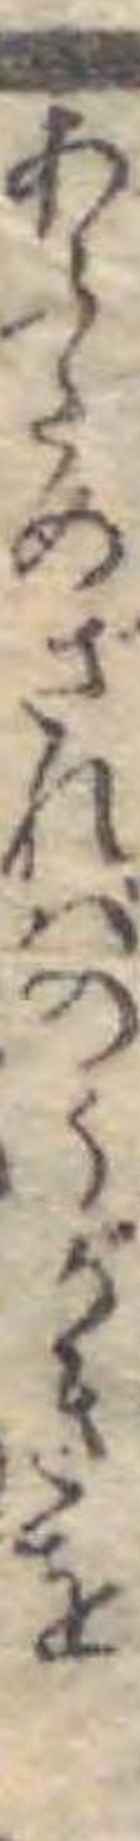あらためざればのうがきを
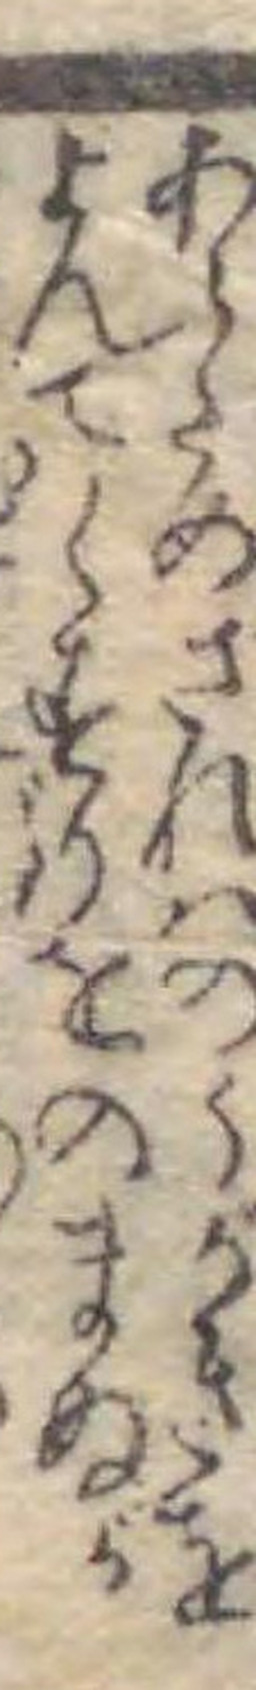よんてくすりをのまぬが
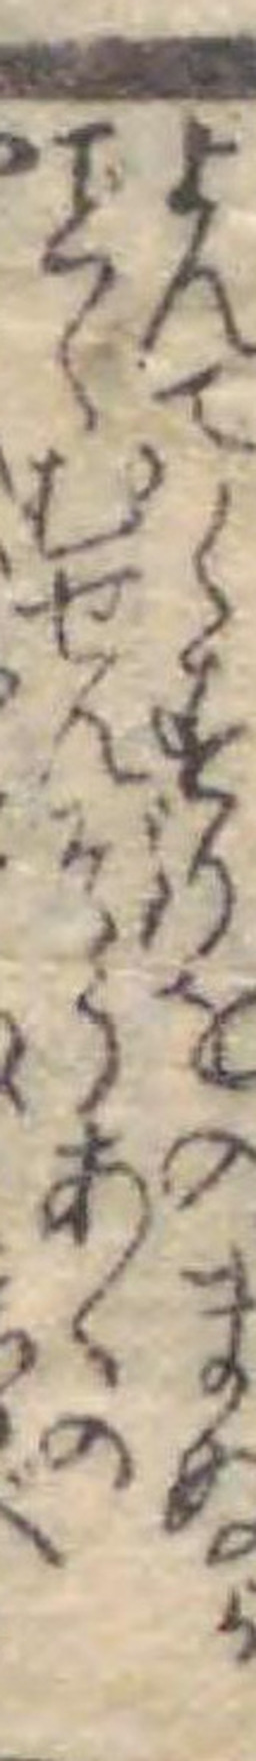ごとくむせんぞうあくの
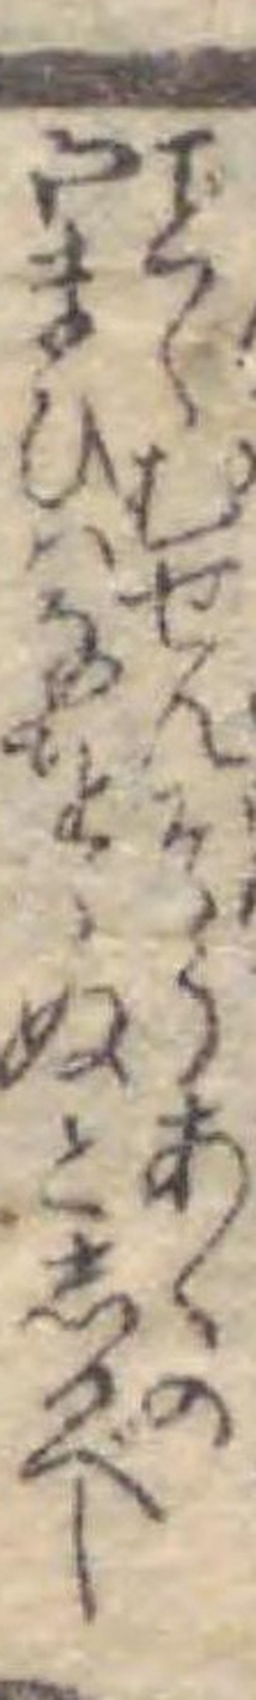やまひはなをらぬとしるべし
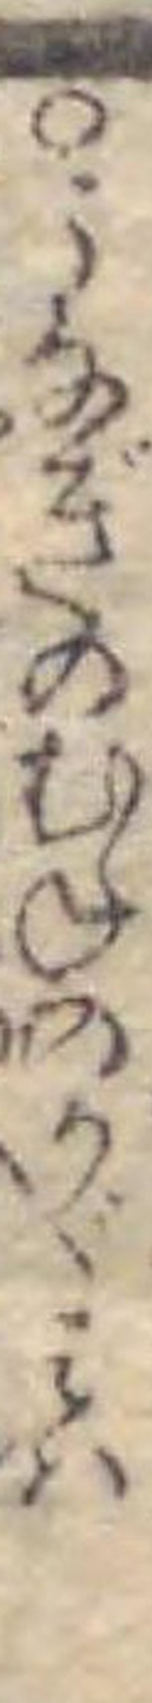○うなぎのむねのかゞみは
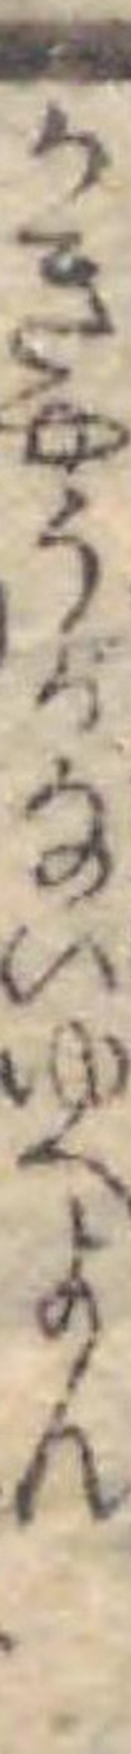かきやうがないゆへよん
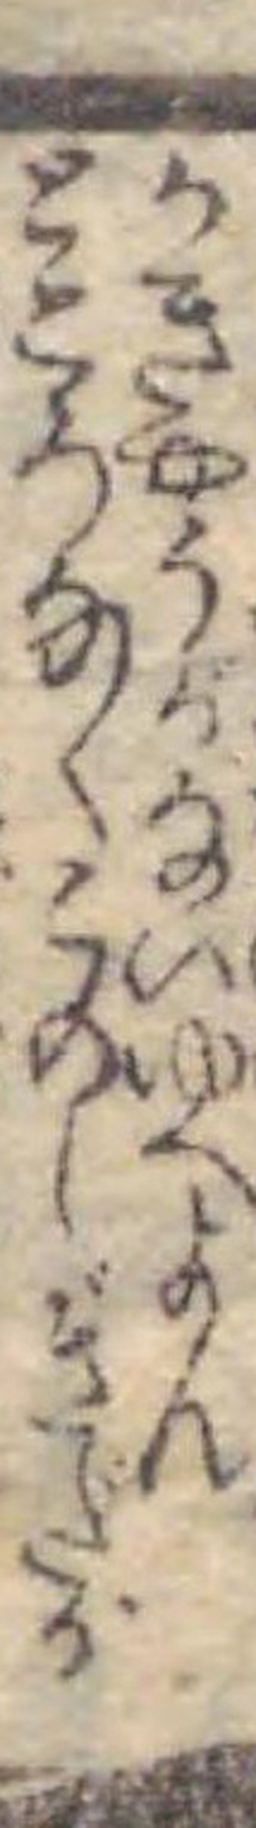ところなくこのしぎだが
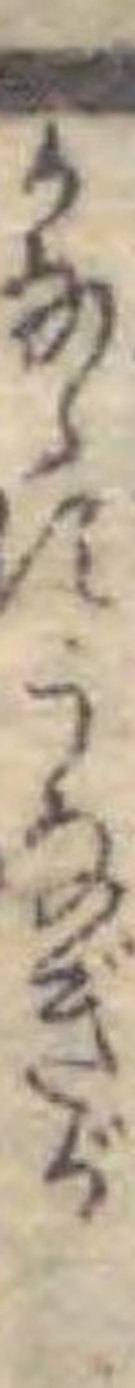かならすうなぎが
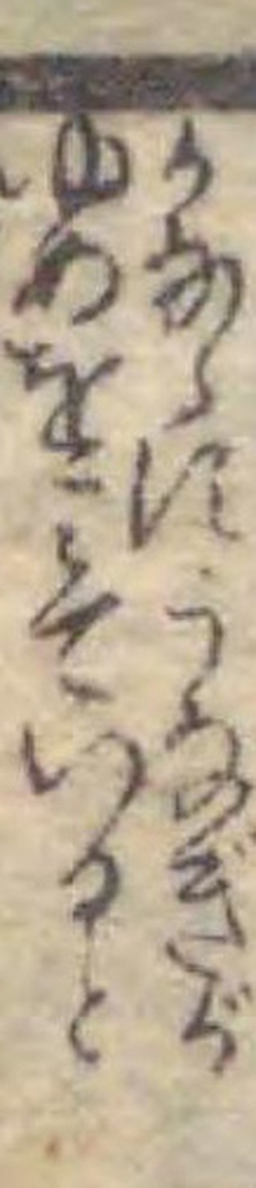ゆめをみていると
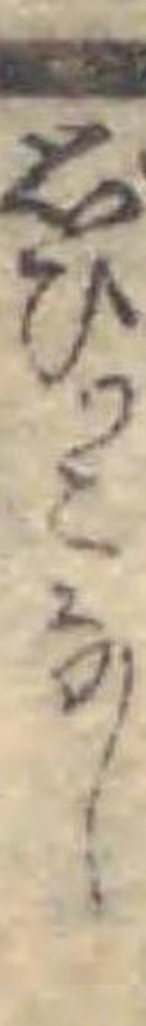おもひつこなし
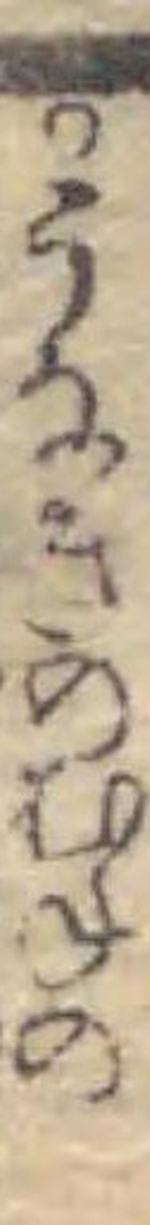○うなきのむねの
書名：人心鏡写絵 : 3巻
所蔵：国立国会図書館 National Diet Library, JAPAN
